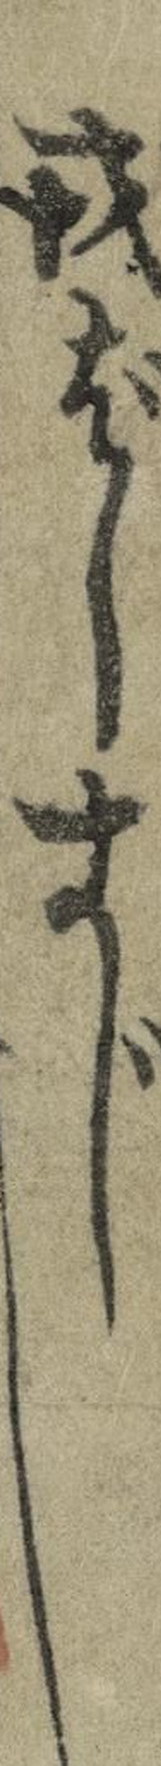戎ばしすじ
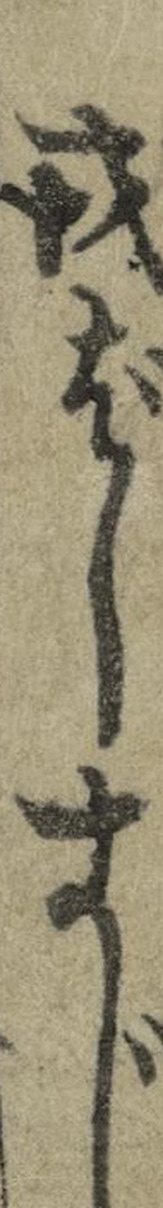戎ばしすじ
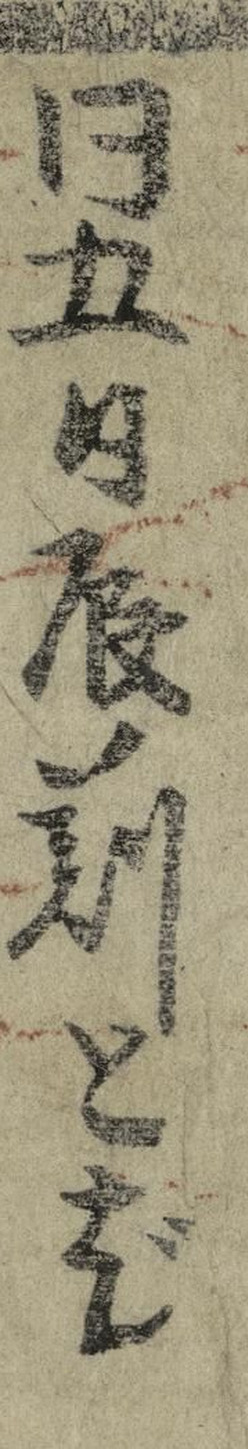同五日辰ノ刻とば
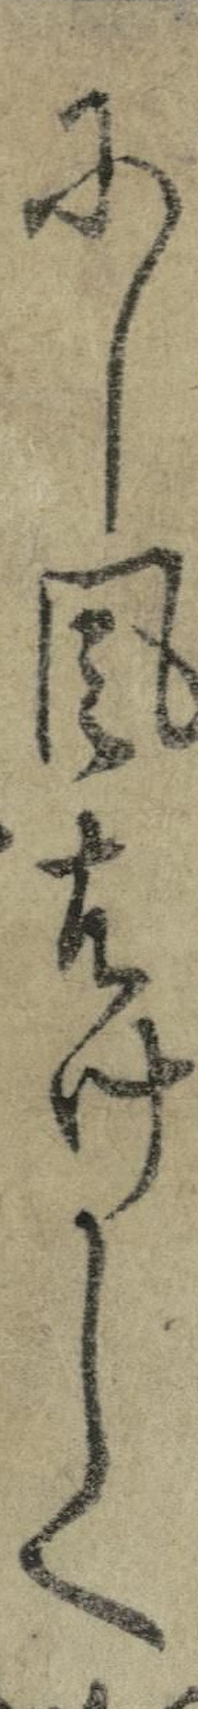にし風はけしく
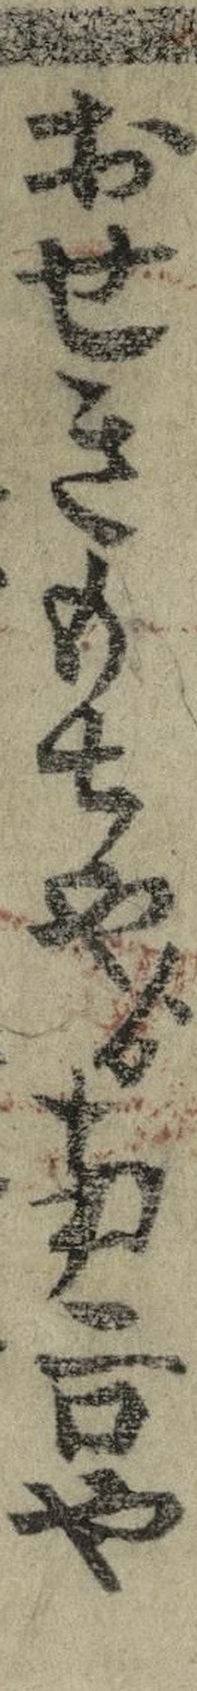おせきもちやゟ南二口や
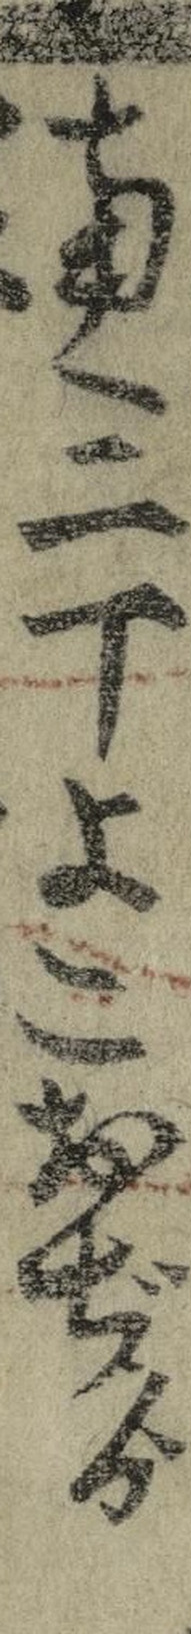南へ二丁よこおぢゟ
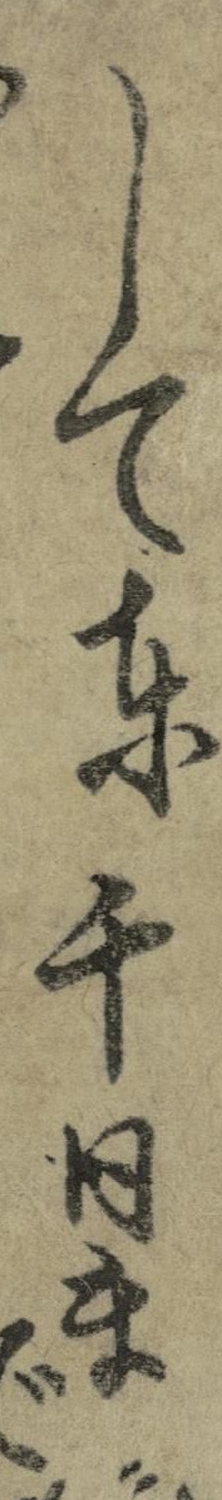して東千日まで
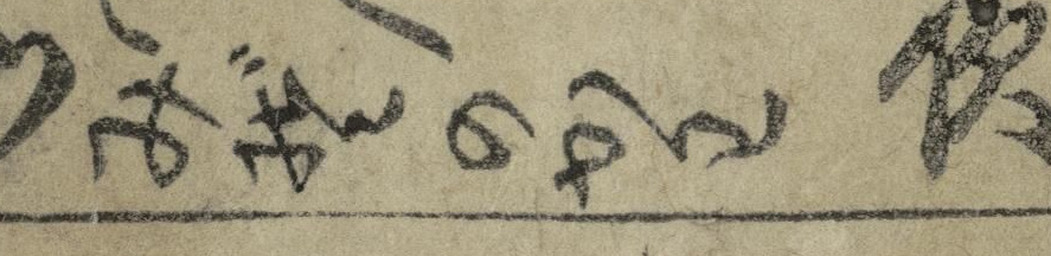みぞのかわ
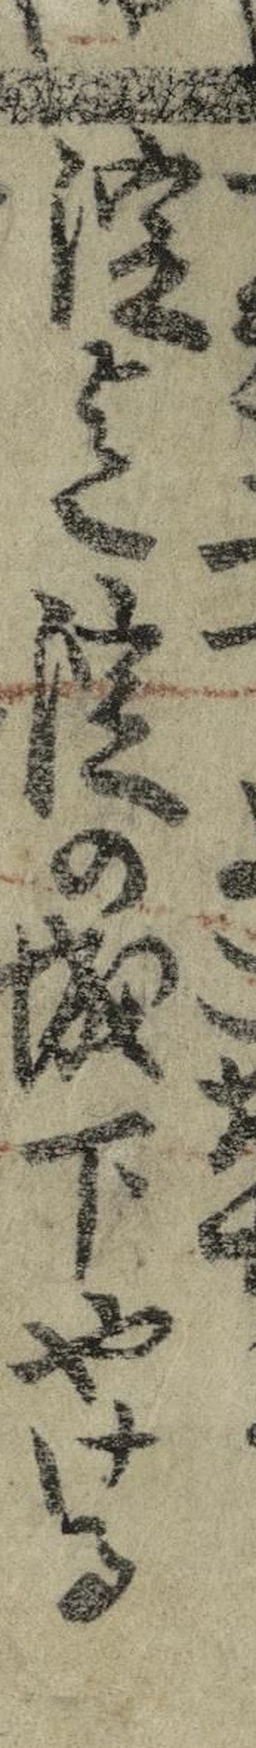淀迄淀の城下やける
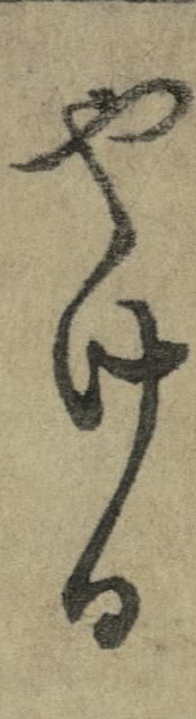やける
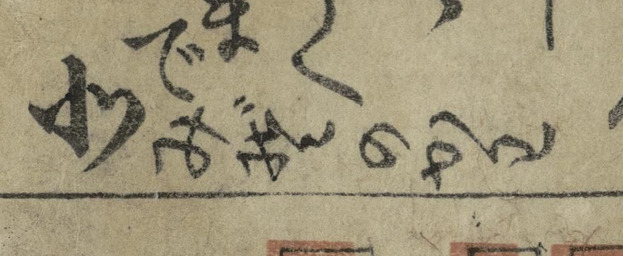みぞのかわ
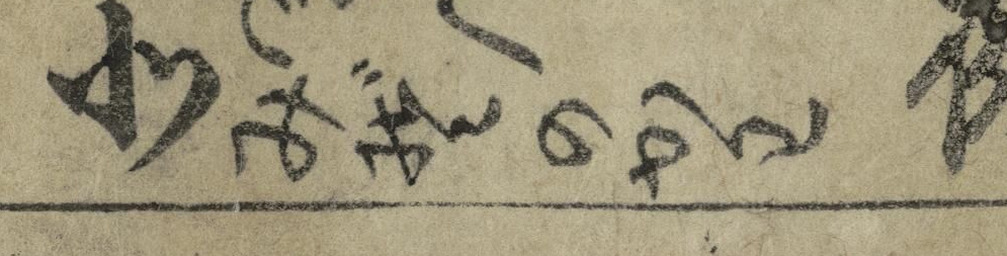みぞのかわ
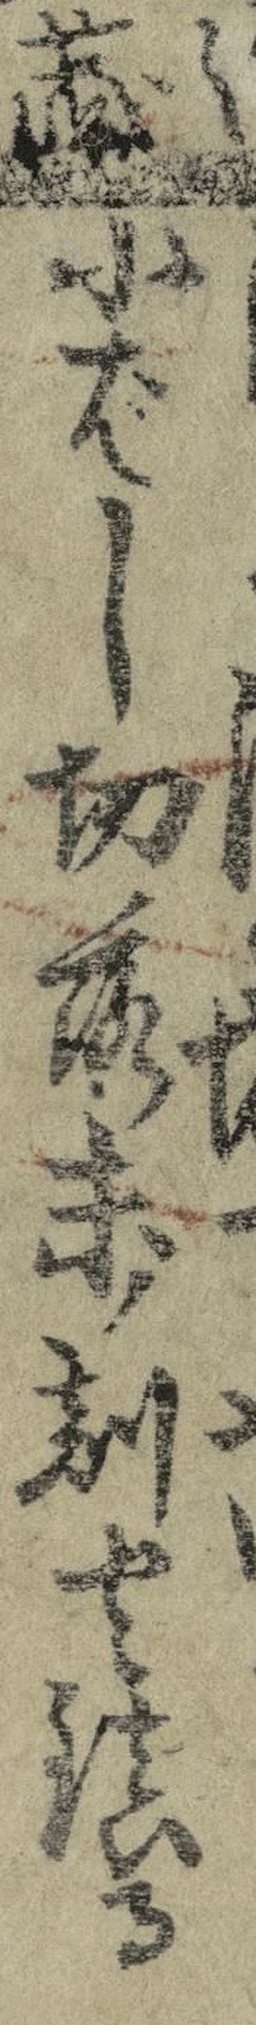小ばし切落未ノ刻火鎮る
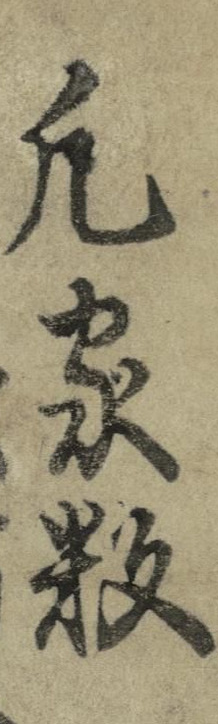凡家数
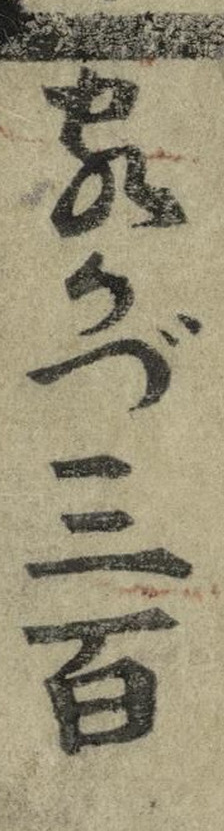家かづ三百
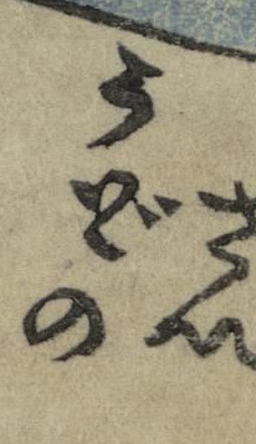うどの
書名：淀川大坂堺大火細見本しらべ
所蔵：東京大学地震研究所図書室 Earthquake Research Institute Library, The University of Tokyo, JAPAN
